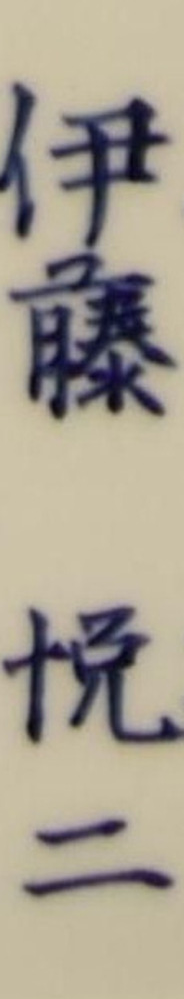伊藤悦二
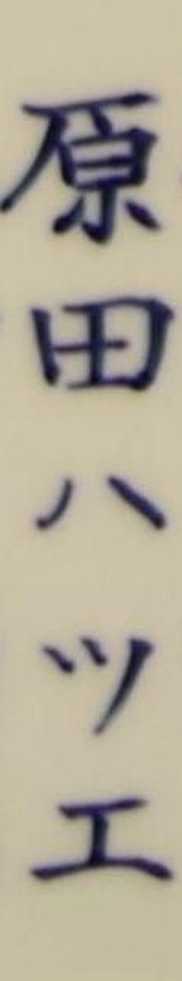原田ハツエ
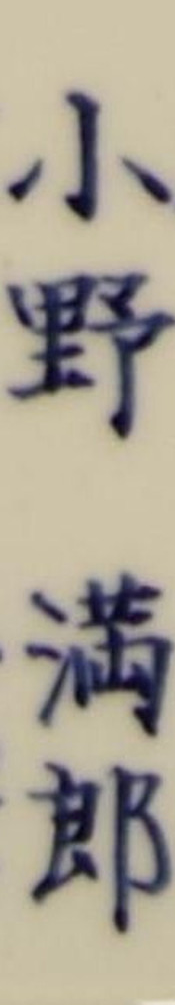小野満郎
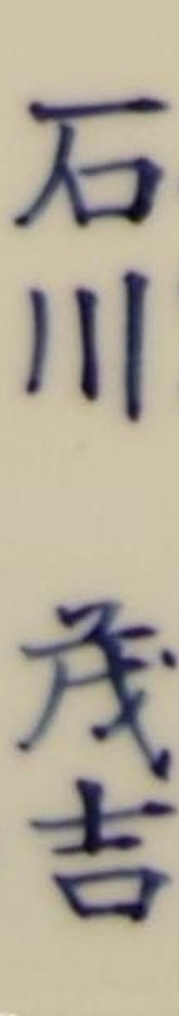石川茂吉
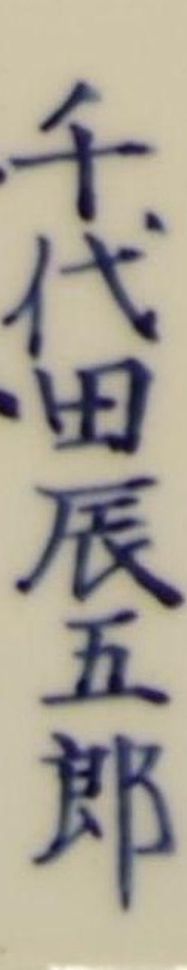千代田辰五郎
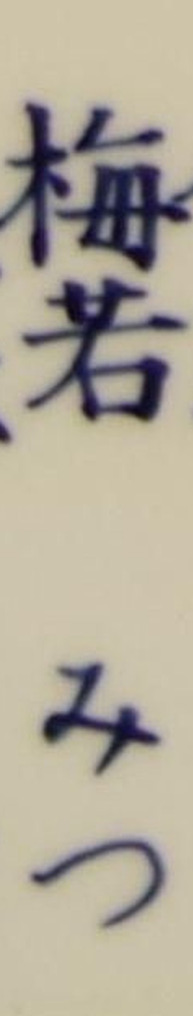梅若みつ
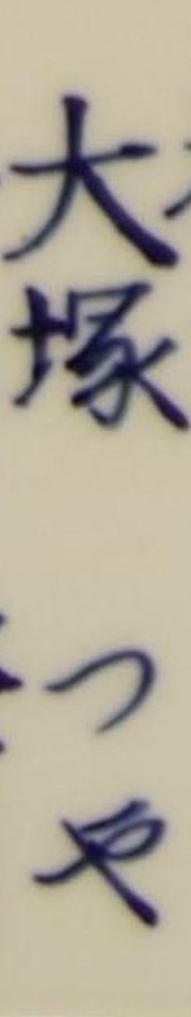大塚つや
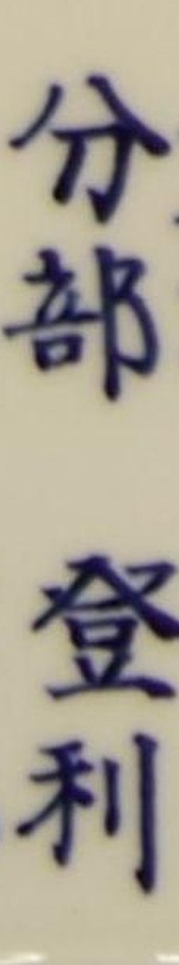分部登利

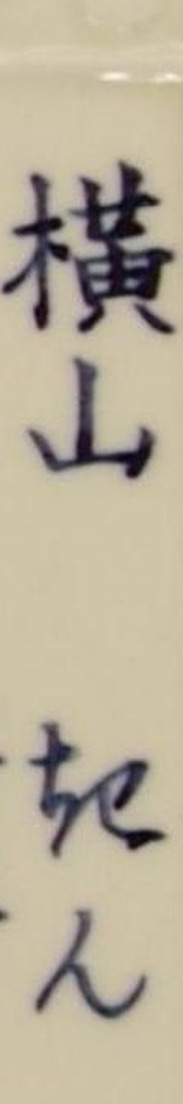横山きん
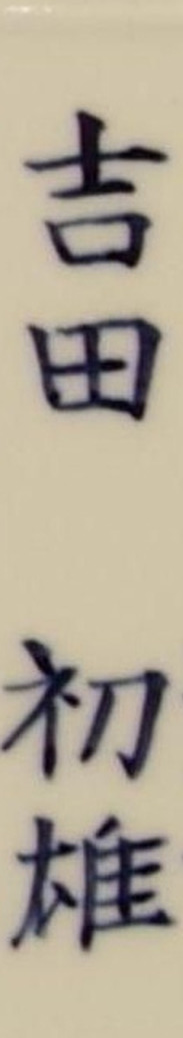吉田初雄
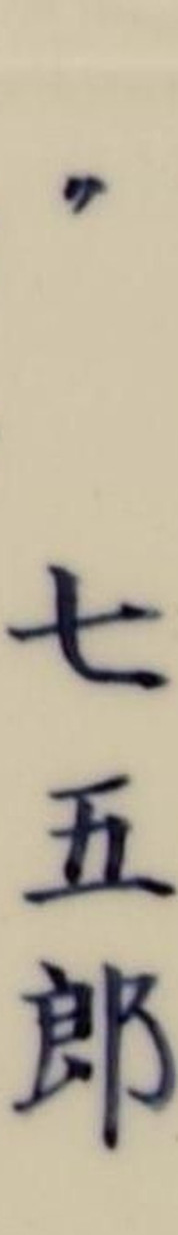七五郎
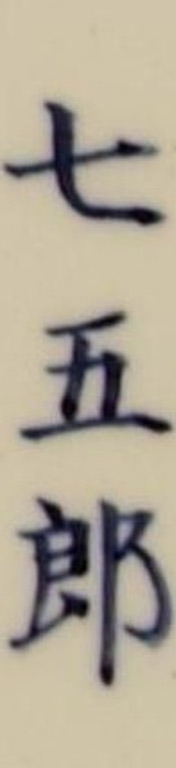七五郎
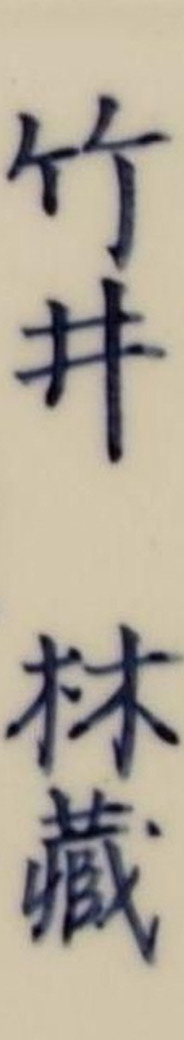竹井林蔵
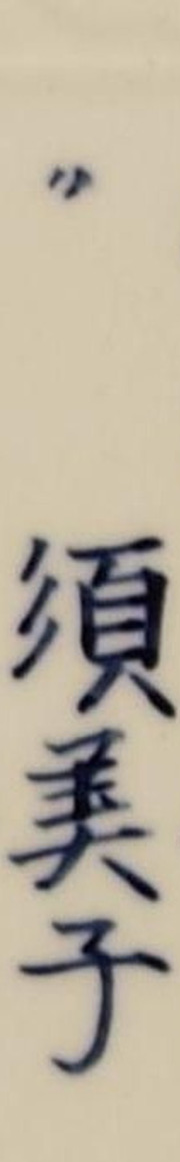須美子
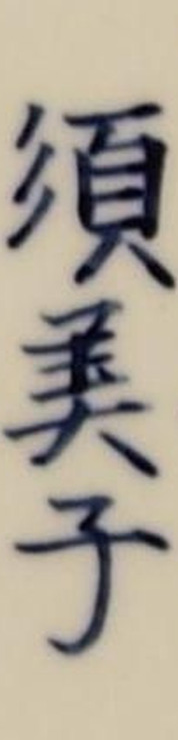須美子
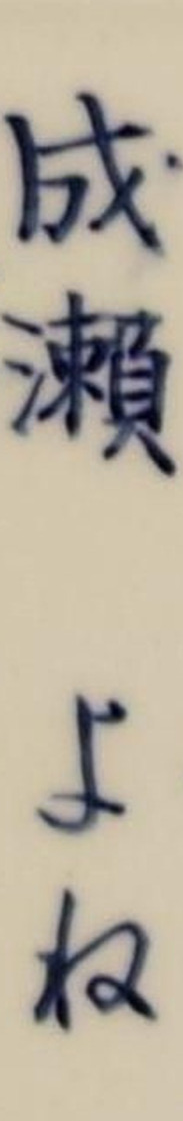成瀬よね
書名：A~D
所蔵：koyasan kongobuji
